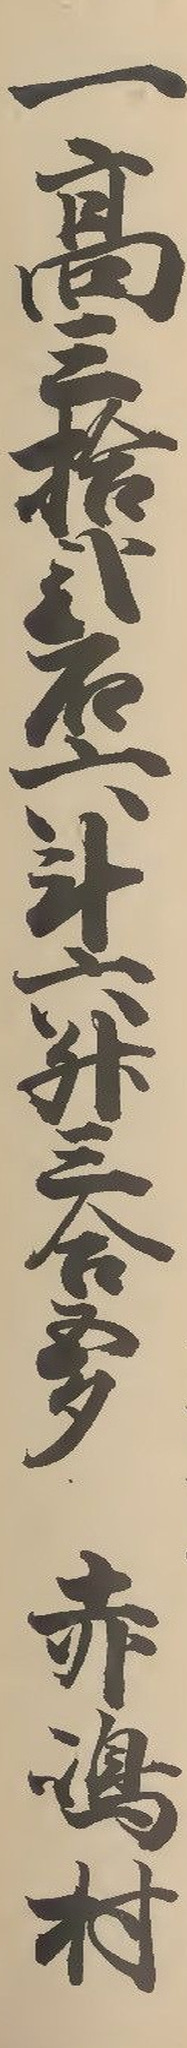一髙三拾弐石六斗六升三合五夕赤嶋村
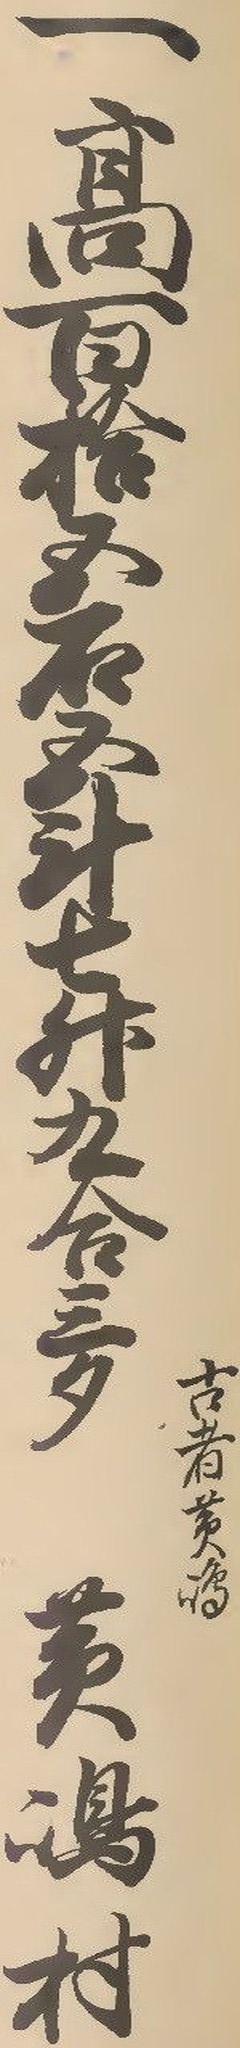一髙百拾五石五斗七升九合三夕黄嶋村
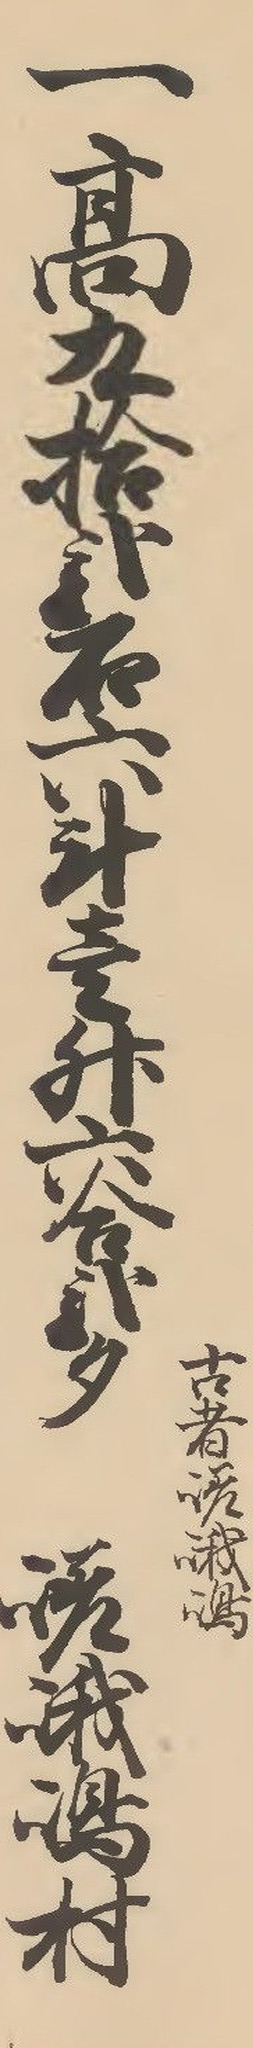一髙九拾弐石六斗壱升六合弐夕嵯峨嶋村
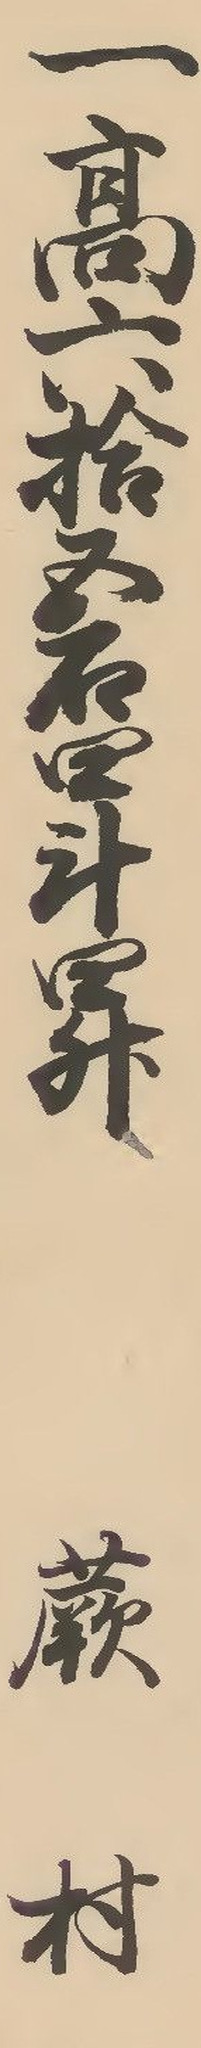一髙六拾五石四斗四升蕨村

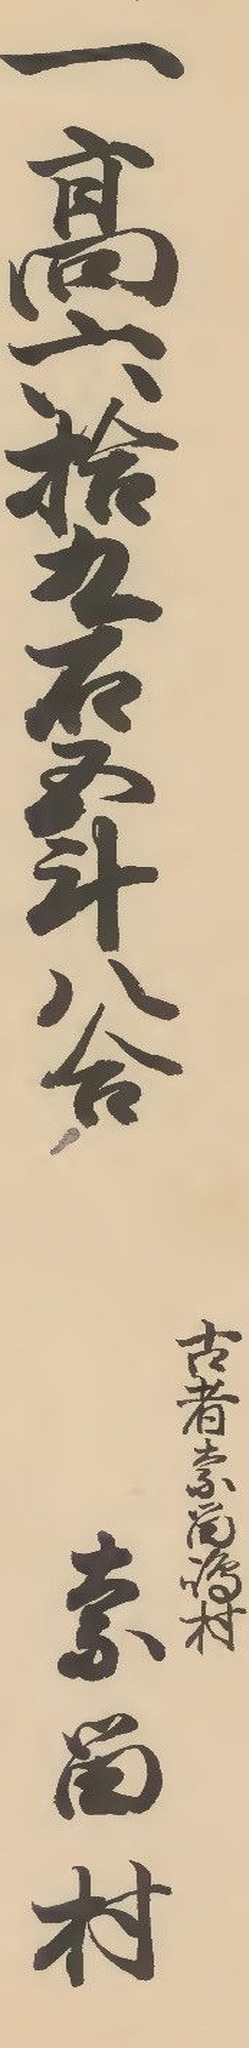一髙六拾九石五斗八合素留村
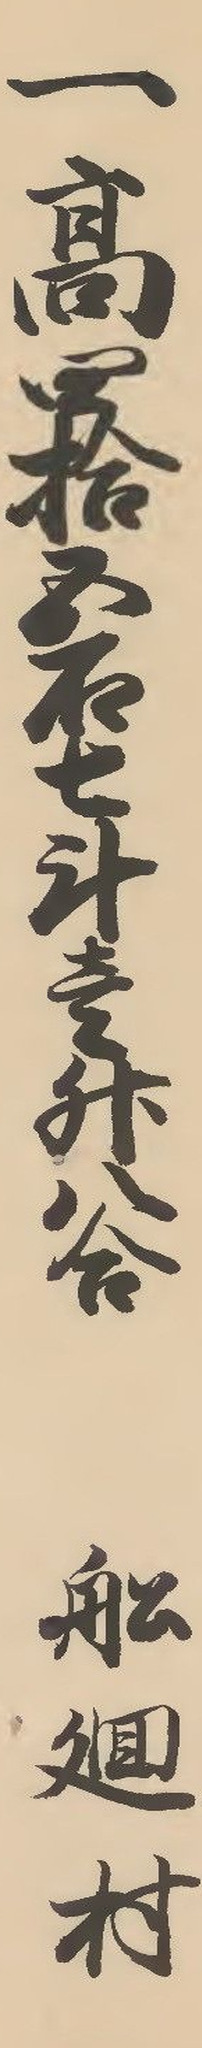一髙四拾五石七斗壱升八合舩廻村
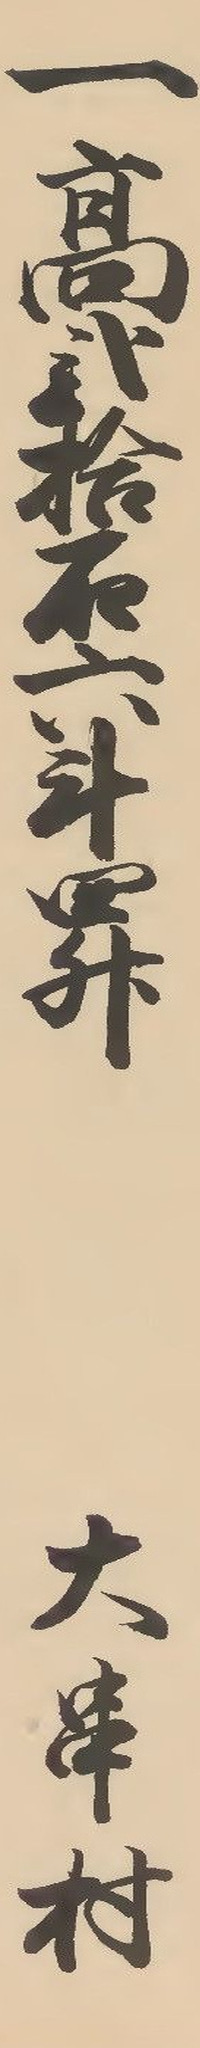一髙弐拾石六斗四升大串村
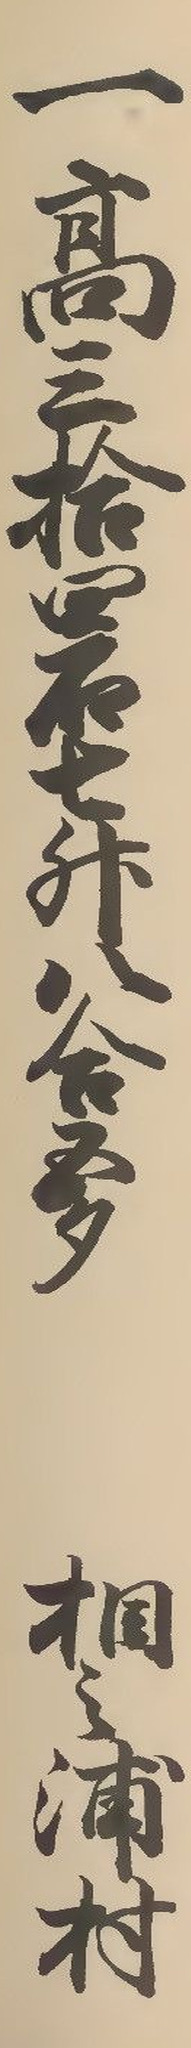一髙三拾四石七升八合五夕相之浦村
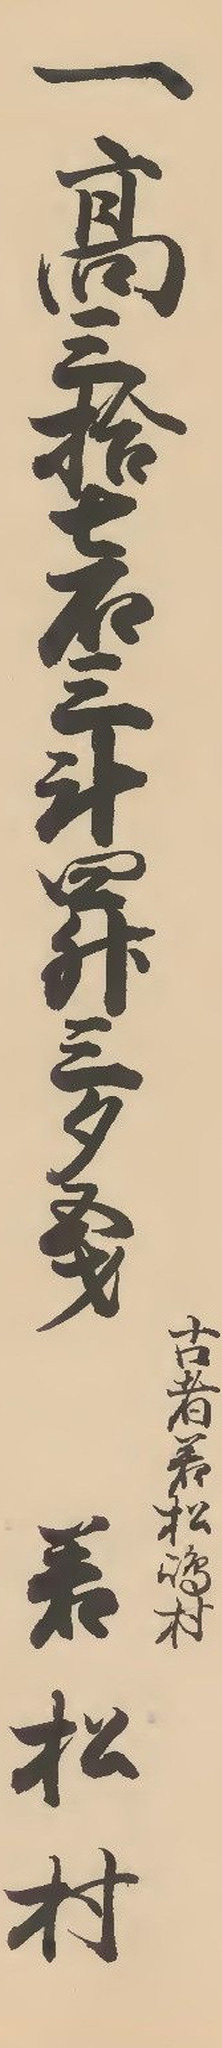一髙三拾七石三斗四升三夕五才若松村
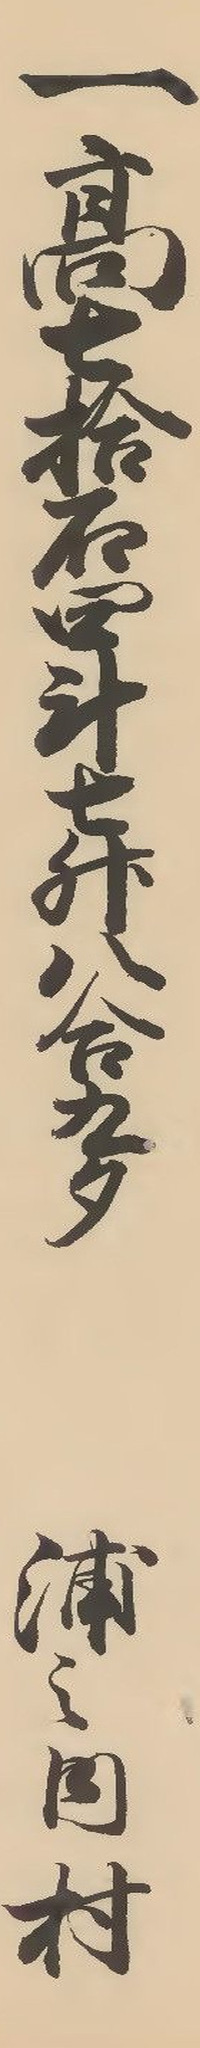一髙七拾石四斗七升八合九夕浦之内村

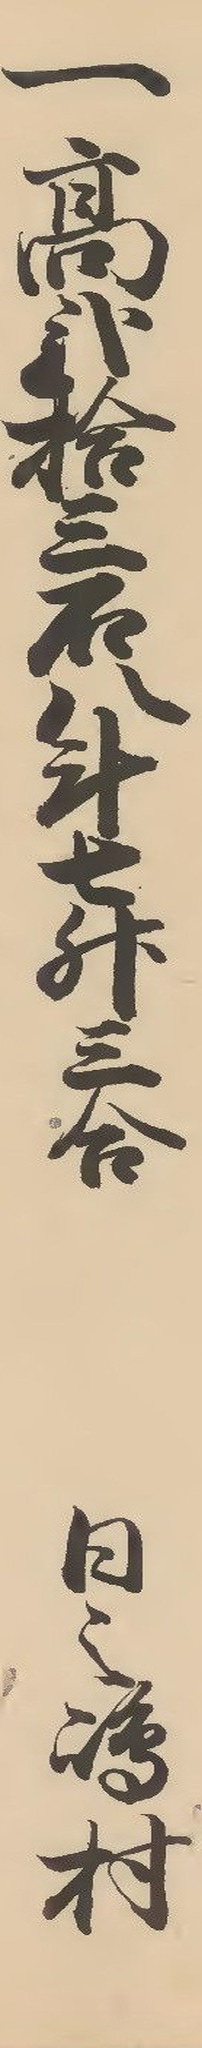一髙弐拾三石八斗七升三合日之嶋村
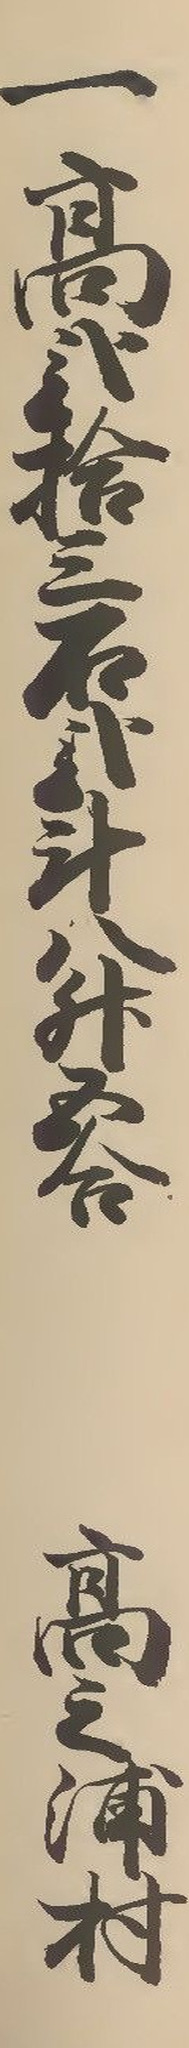一髙弐拾三石弐斗八升五合髙之浦村
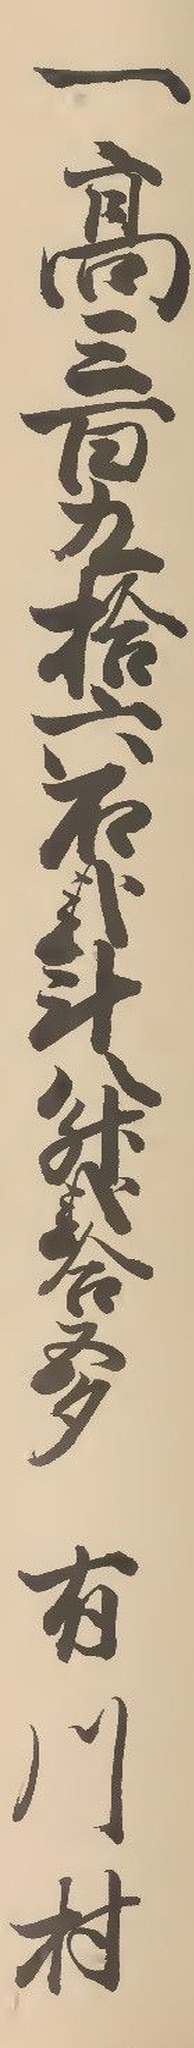一髙三百九拾六石弐斗八升弐合五夕有川村
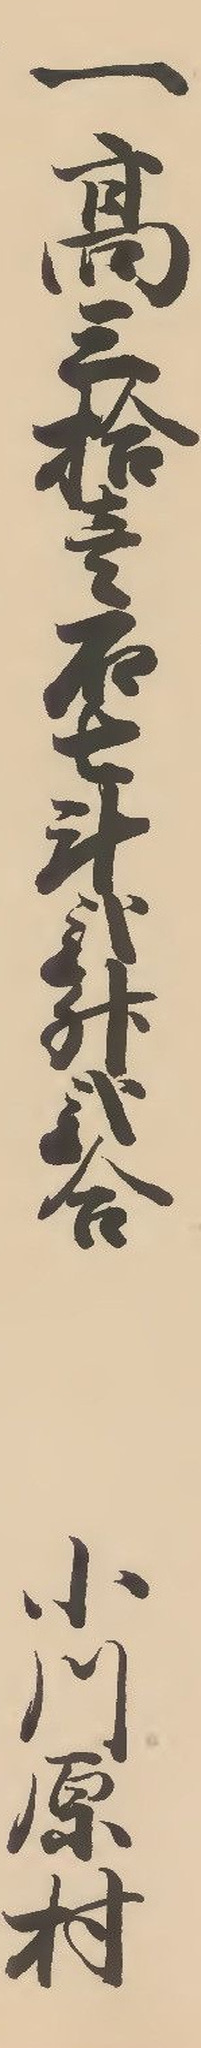一髙三拾壱石七斗弐升弐合小川原村
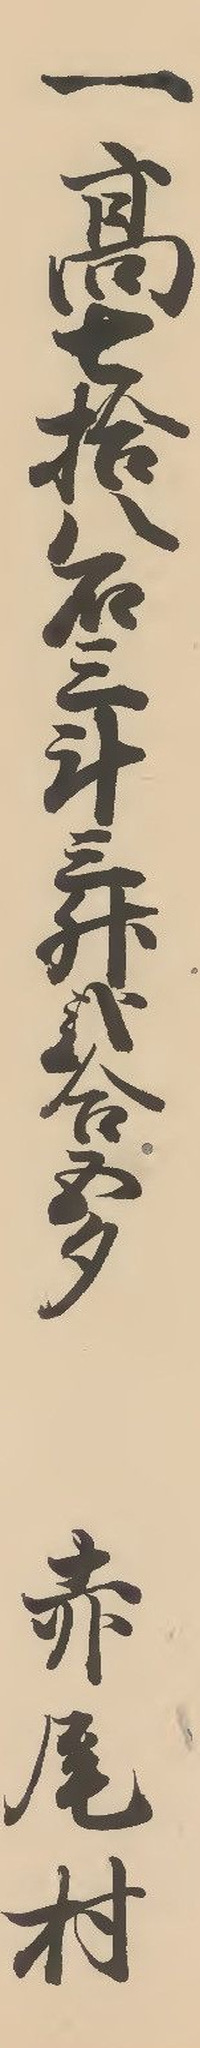一髙七拾八石三斗三升弐合五夕赤尾村
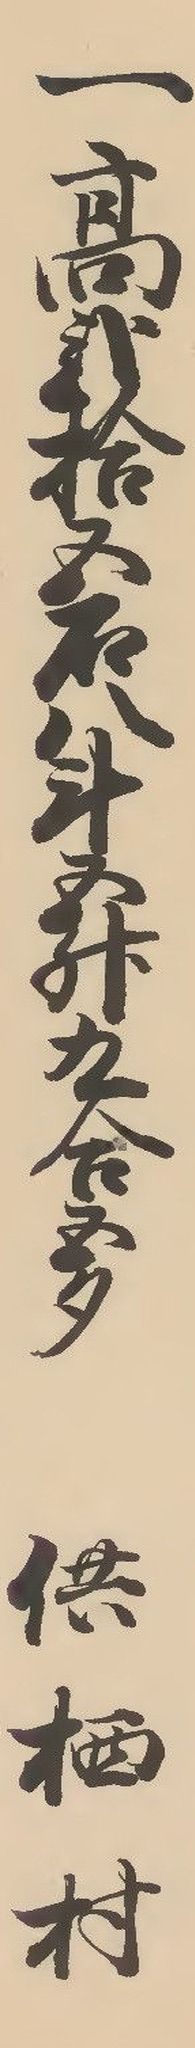一髙弐拾五石八斗五升九合五夕供栖村
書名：肥前国郷帳
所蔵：国立公文書館 National Archives of Japan
